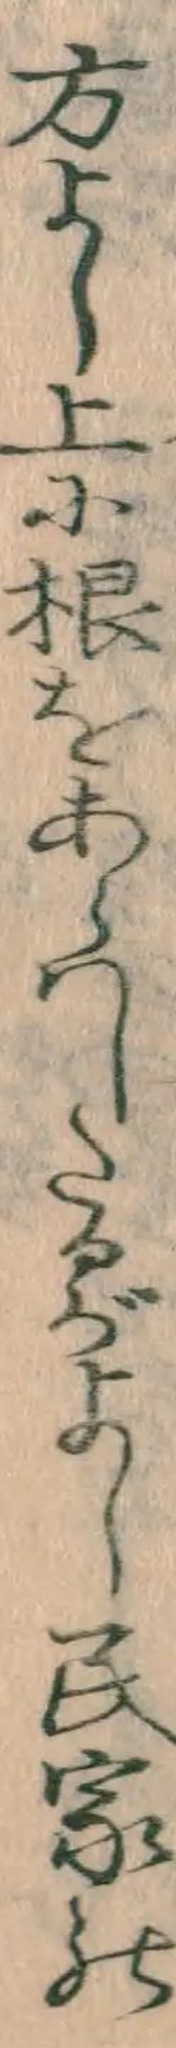方よし上に根をあらはしたるがよし民家の
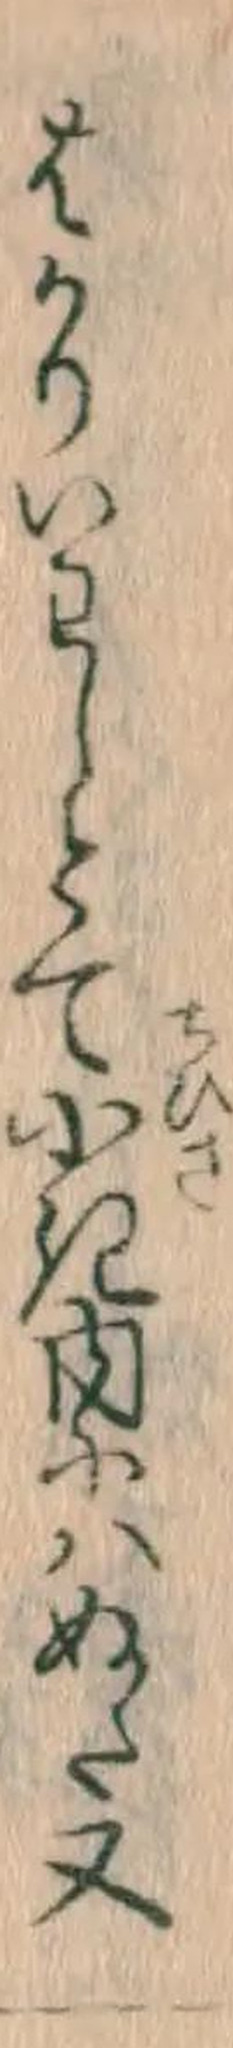はかりいわしとて小き内にはぬた又
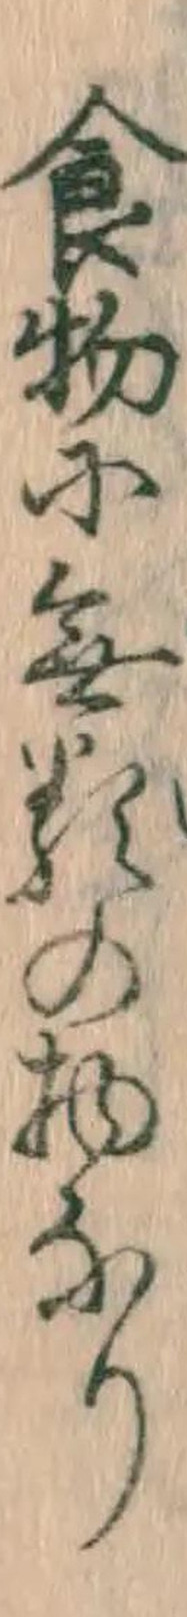食物に無類の物なり
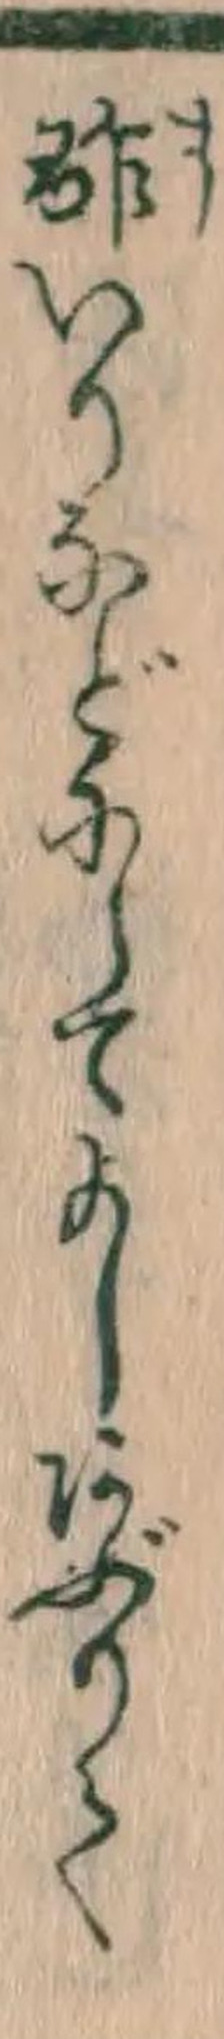酢いりなどにしてよしあぶりて
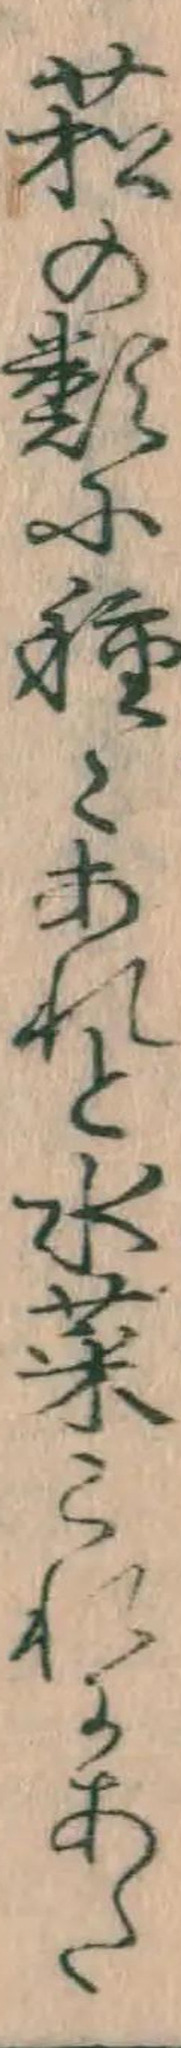一菘菘の類に種々あれと水菜これにあた
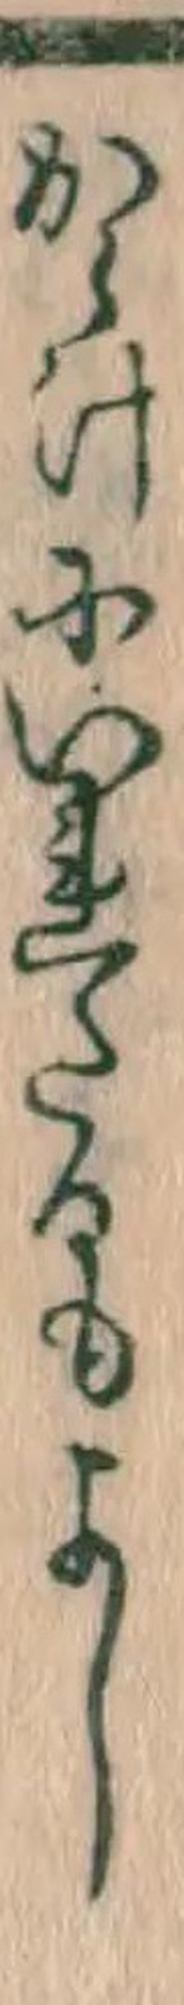から汁にいれたるもよし
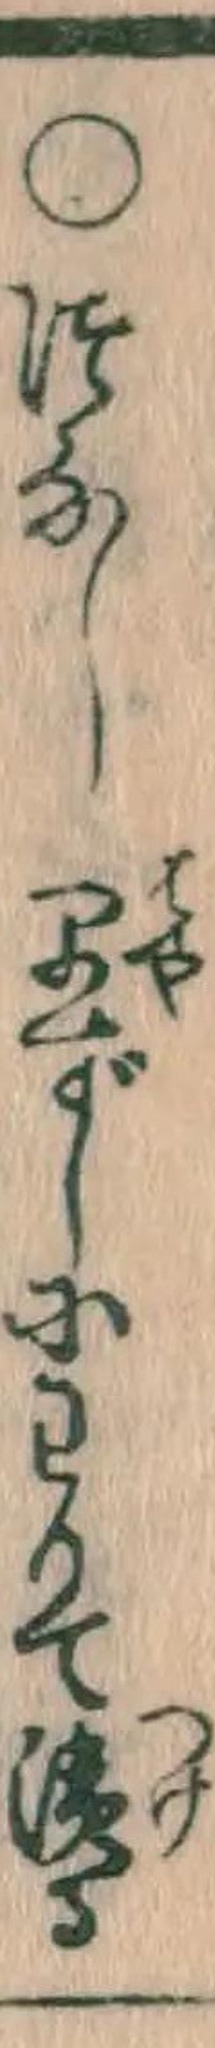○つなし早ずしにわりて漬る
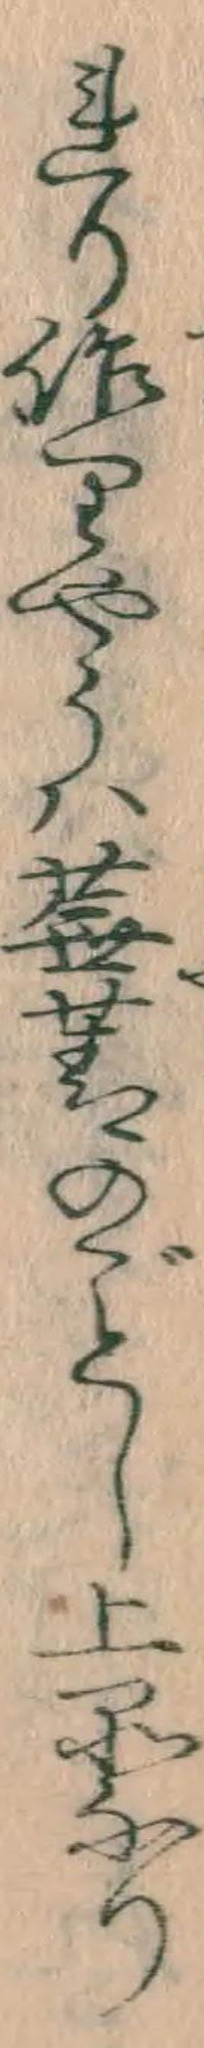れり作りやうは蕪菁のごとし上品なり
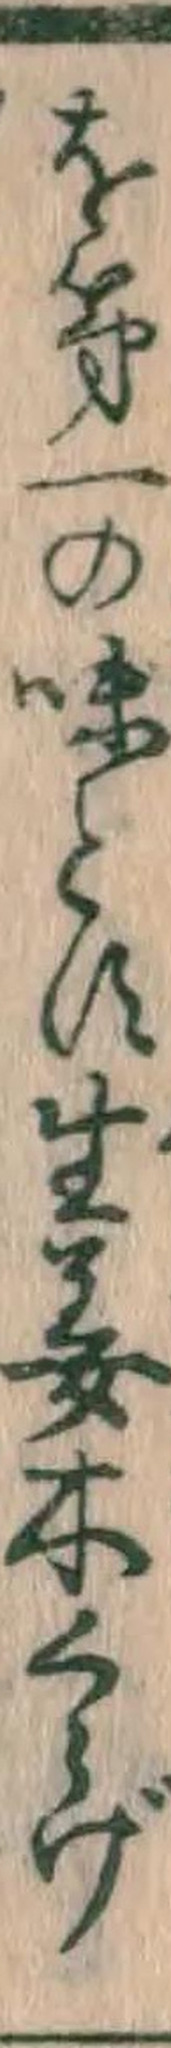を第一の味とす生姜木くらげ
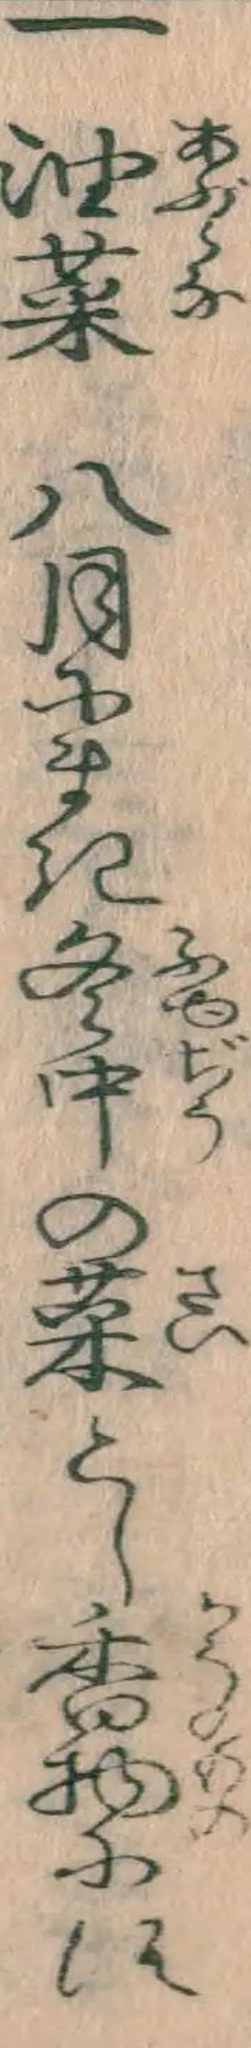一油菜八月にまき冬中の菜とし香物にす
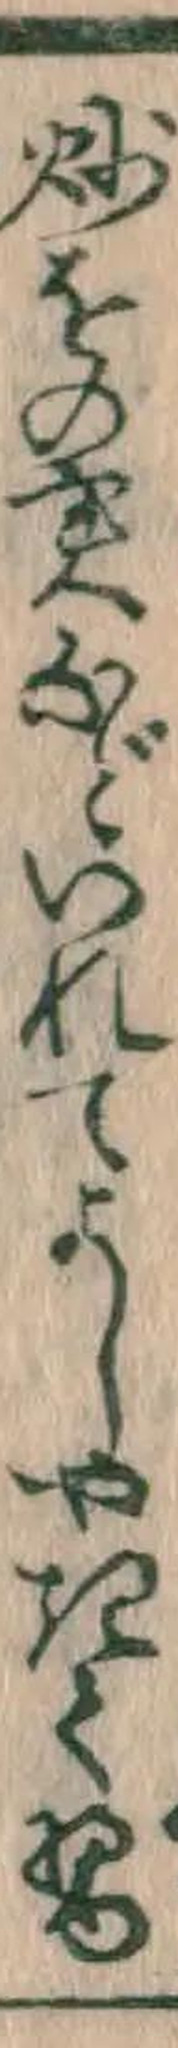炒をの実などいれてよしやきて醬
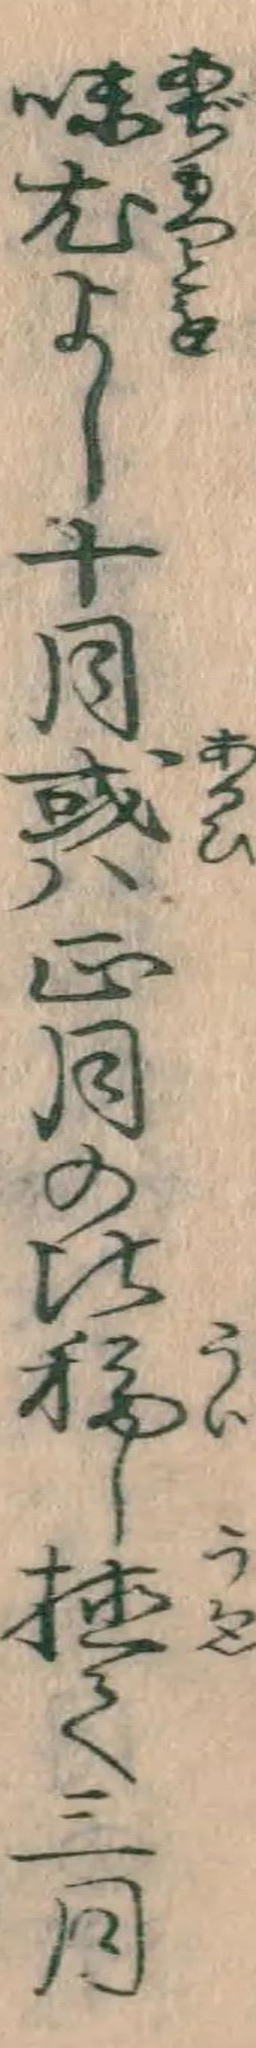味尤よし十月或は正月の比移し植て三月
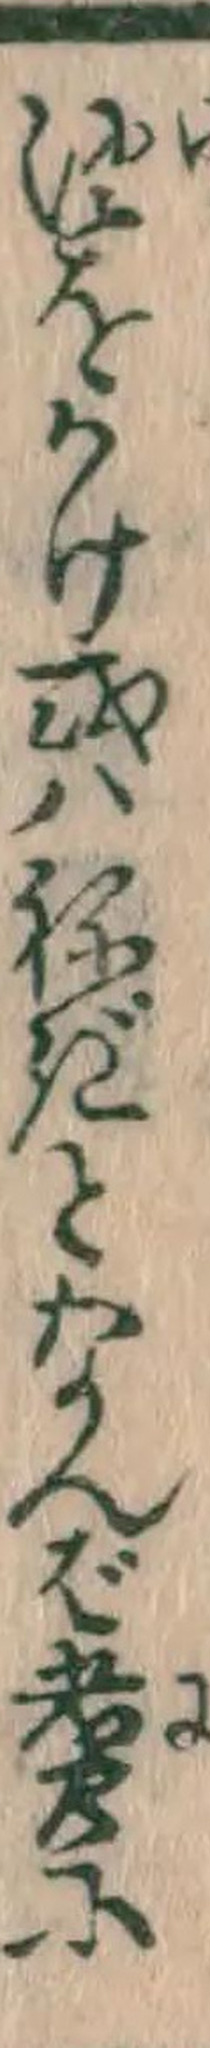油をかけ或はねぎとなんば煮に
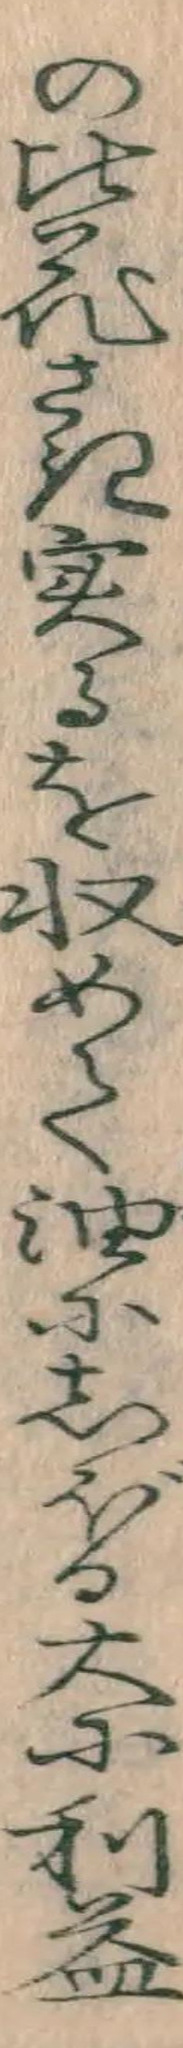の比花さき実るを収めて油にしぼる大に利益
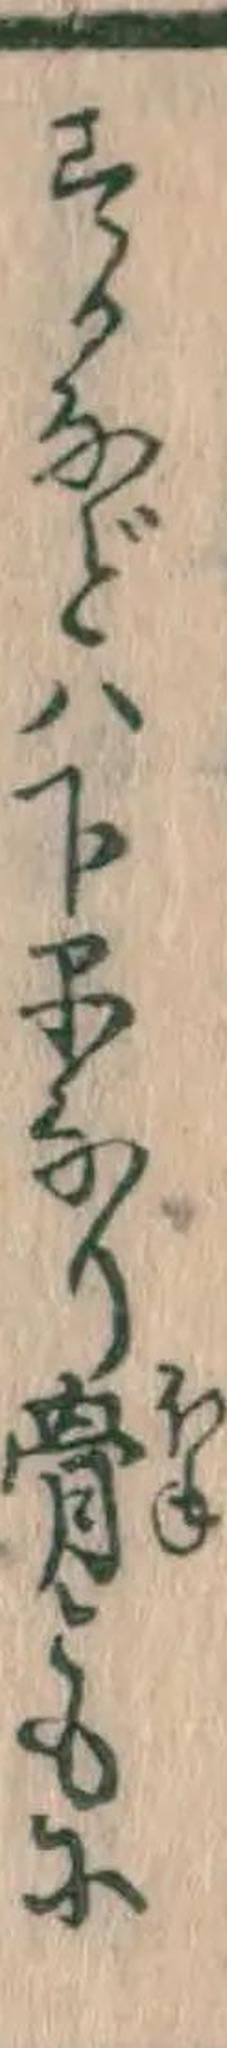するなどは下品なり骨ともに
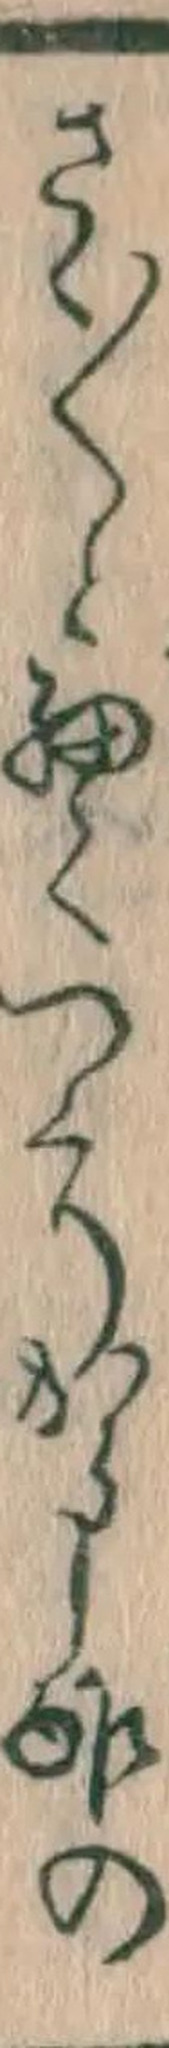さく〳〵と細くつくりからし酢の
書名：広益秘事大全 3巻. [5]
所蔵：国立国会図書館 National Diet Library, JAPAN
